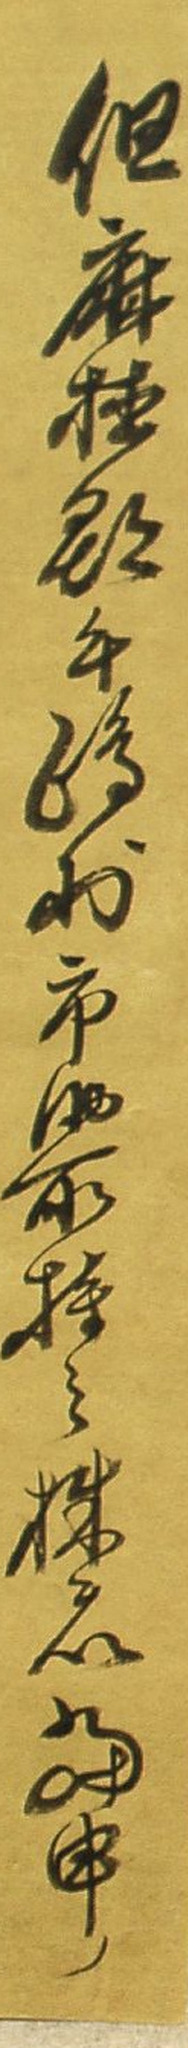但麻植郡牛嶋村市助所持之株を以当申の
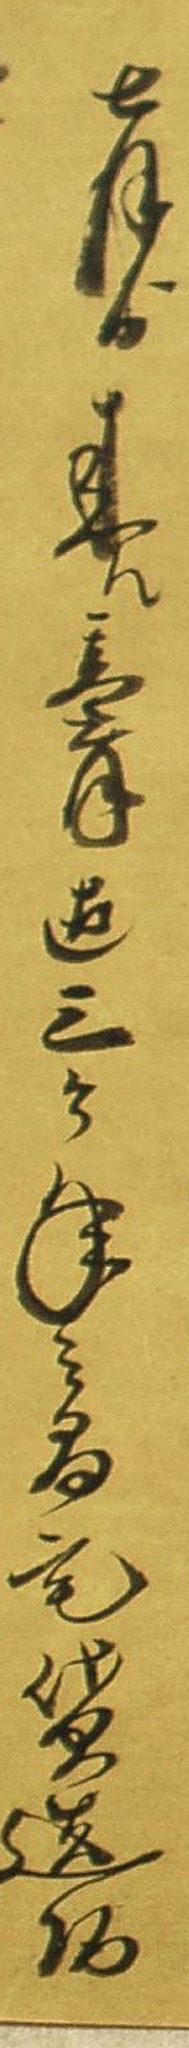七月より来る亥六月迄三ヶ年之間宅貸造酒
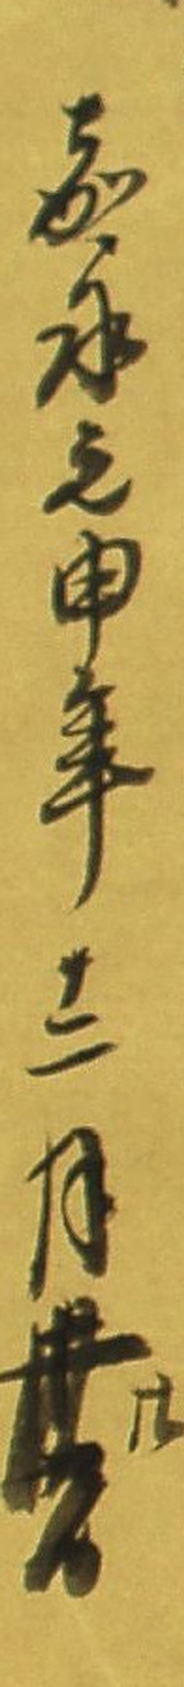嘉永元申年十二月廿日

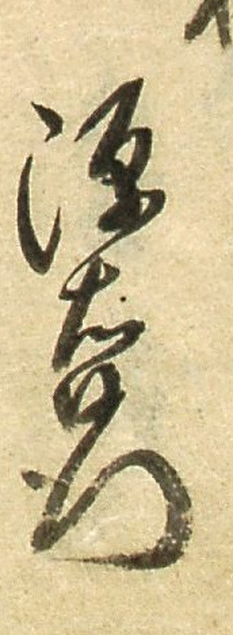源右衛門
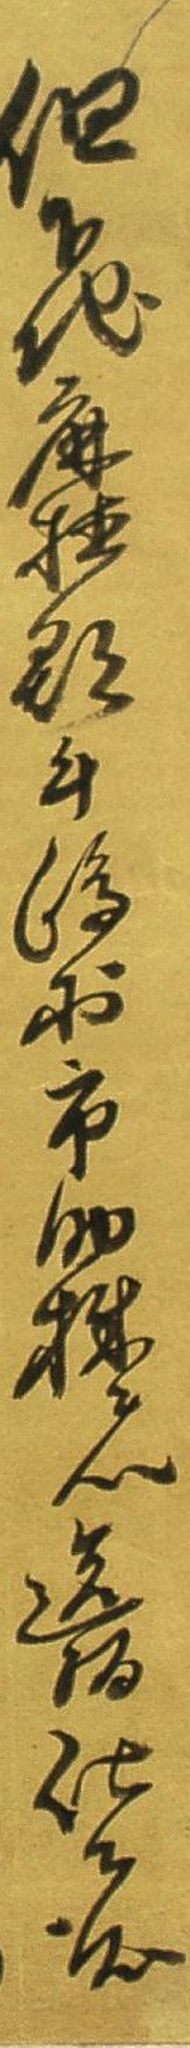但下地麻植郡牛嶋村市助株を以造酒仕候所
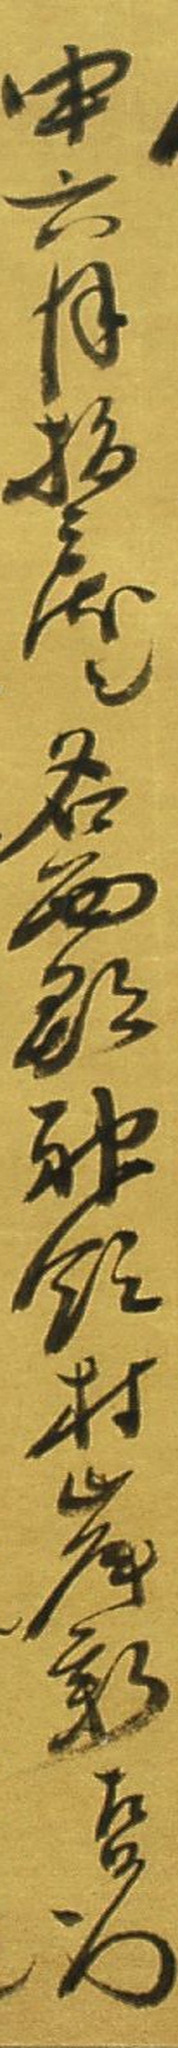申六月指戻し名西郡神領村岸新左衛門
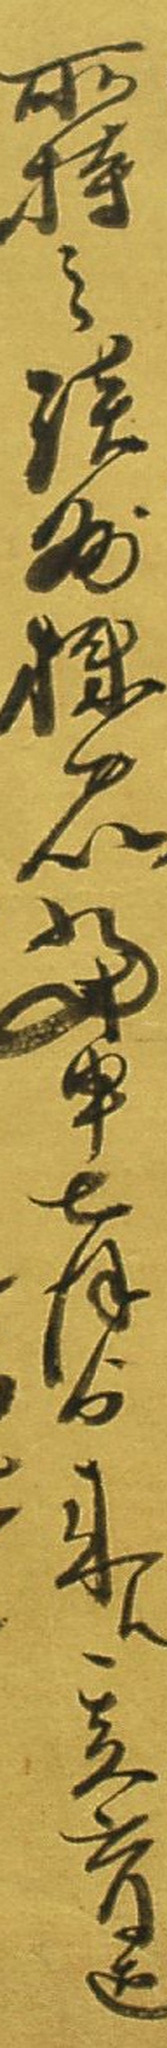所持の淡州株を以て当申七月より来る亥六月迄
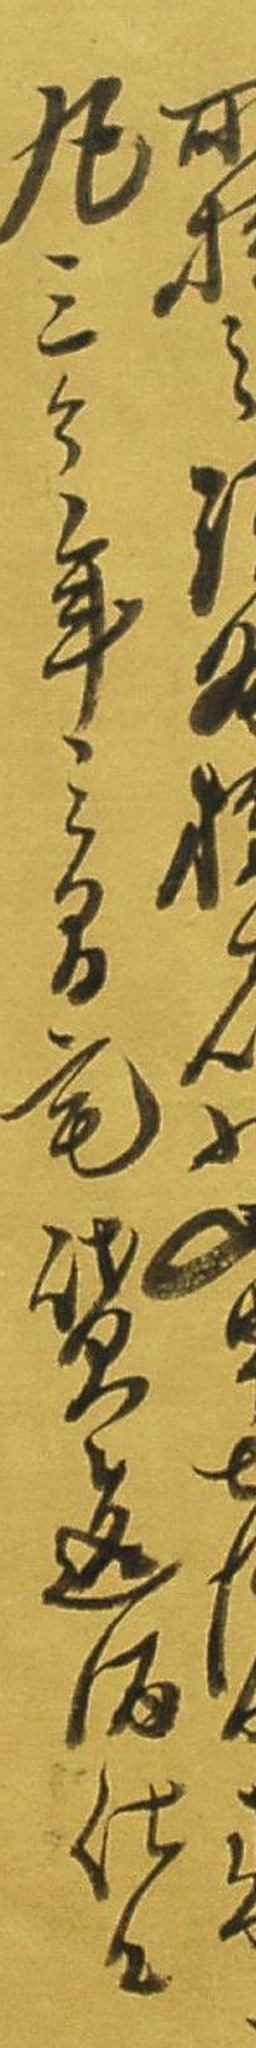丸三ヶ年之間宅貸造酒仕候
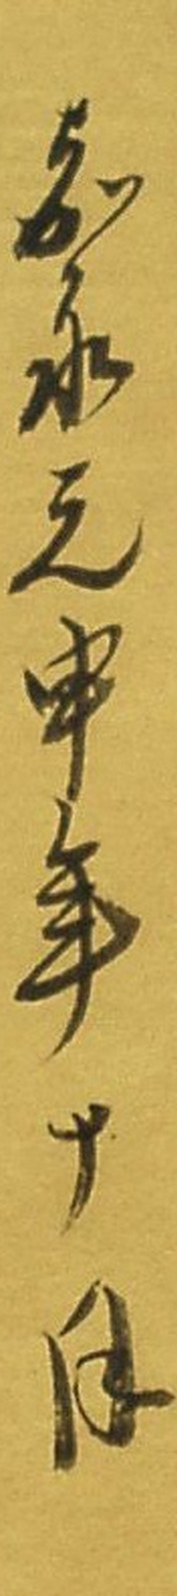嘉永元申年十月
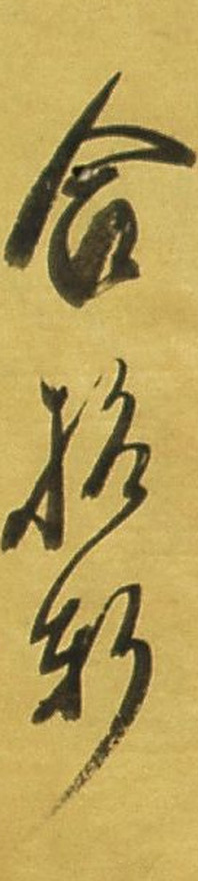合拾軒
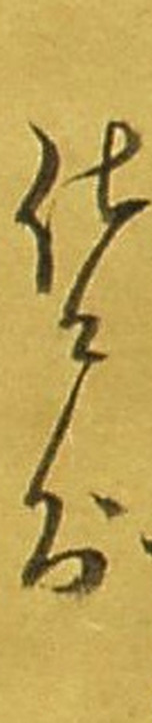仕候分
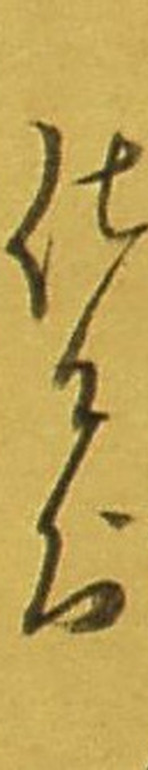仕候分
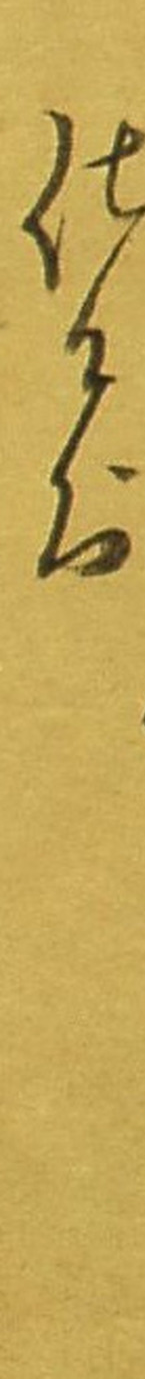仕候分
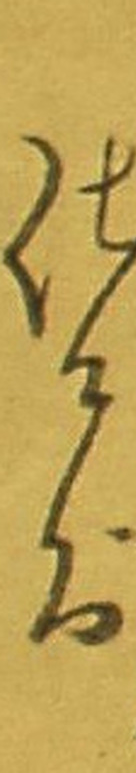仕候分
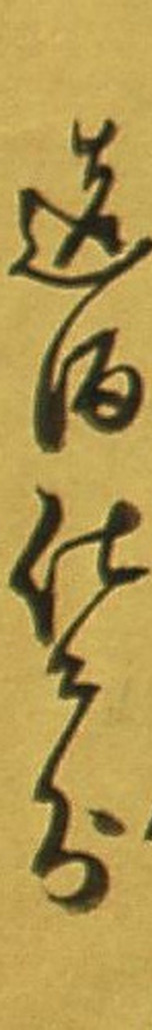造酒仕候分
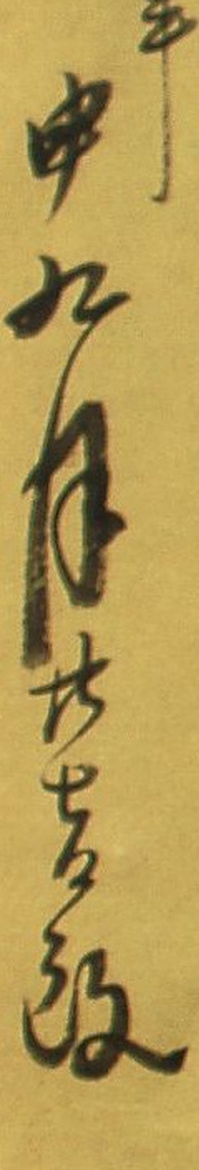申九月廿七日改
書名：名東郡中酒株並造酒屋軒数取調帳
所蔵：鳴門教育大学 Naruto University of Education
